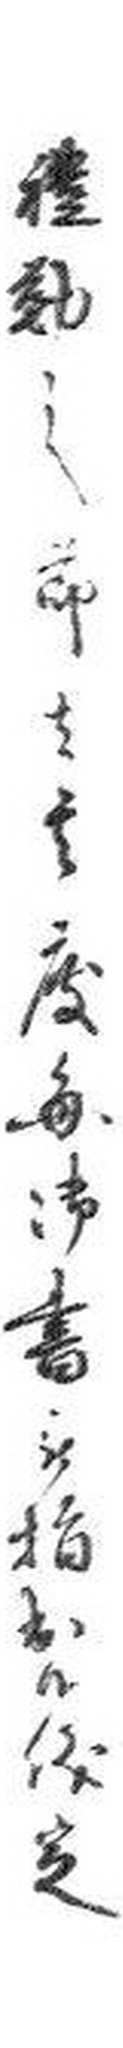礼勤之節者其度毎御書被指出候儀定
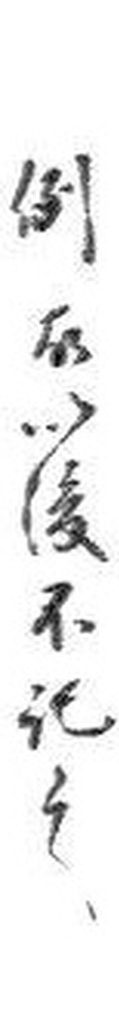例故以後不記之
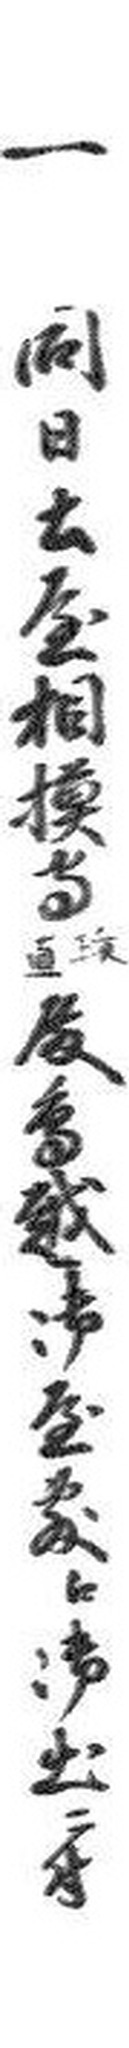一同日土屋相模守政直殿鳥越御屋敷江御出ニ付
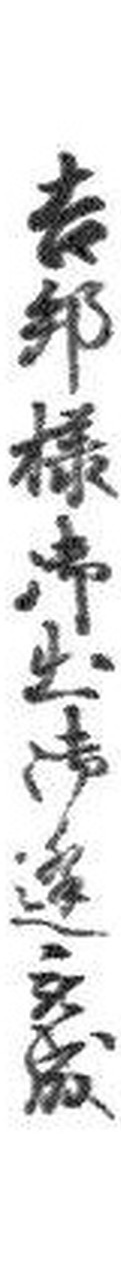吉邦様御出御逢被成
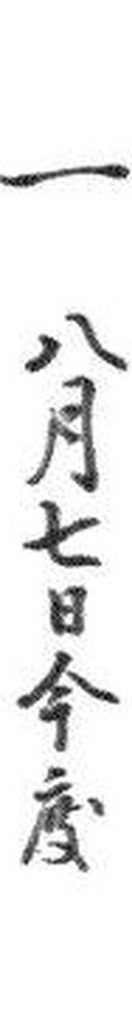一八月七日今度
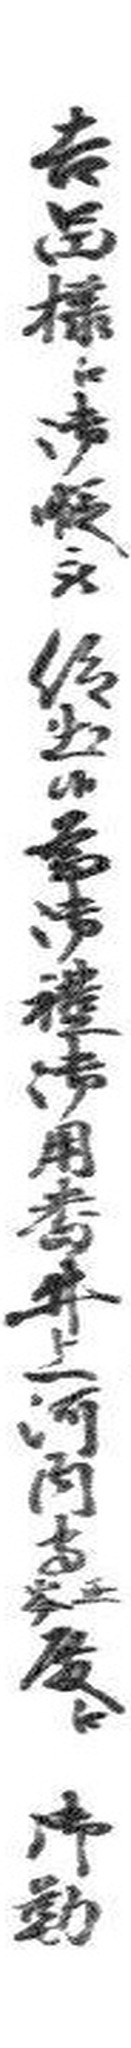吉品様江御暇被仰出候為御礼御用番井上河内守正岑殿江御勤
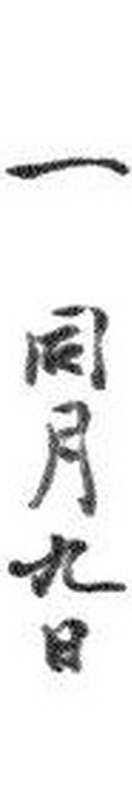一同月九日
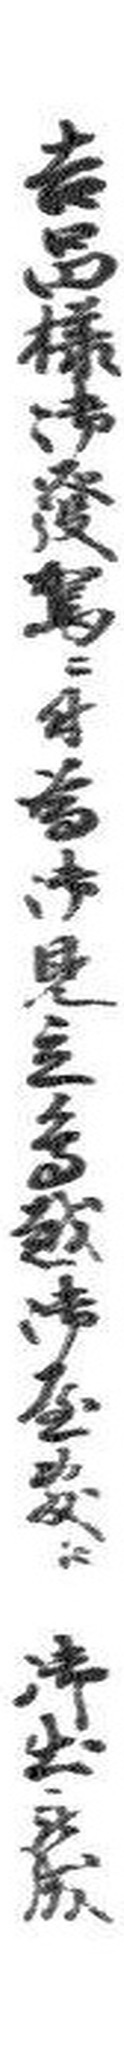吉品様御発駕ニ付為御見立鳥越御屋敷江御出被成
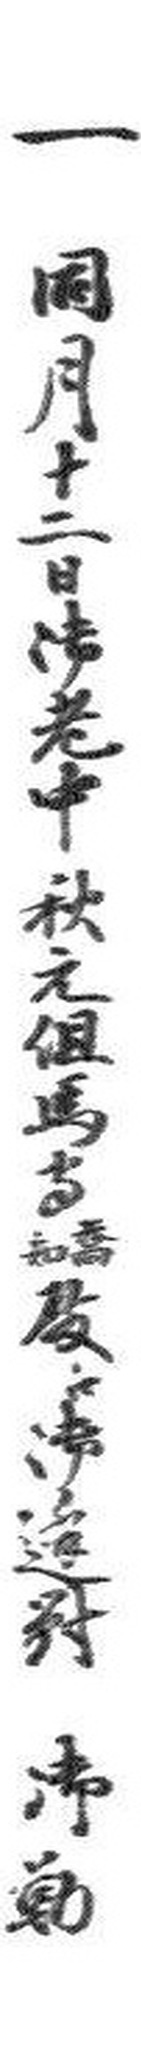一同月十二日御老中秋元但馬守喬知殿江御逢對御勤
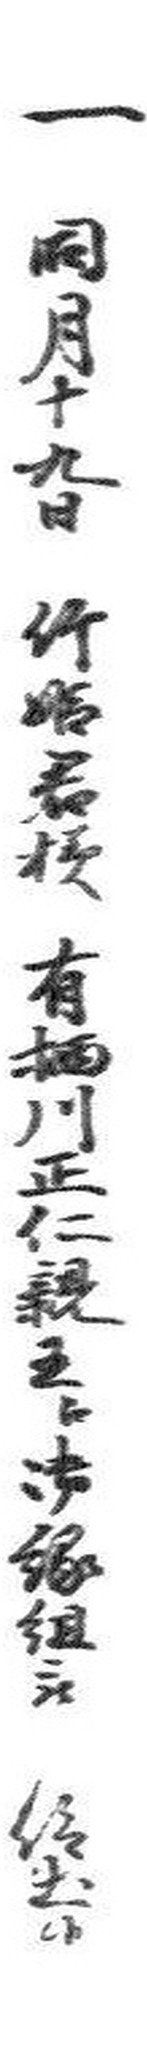一同月十九日竹姫君様有栖川正仁親王江御縁組被仰出候

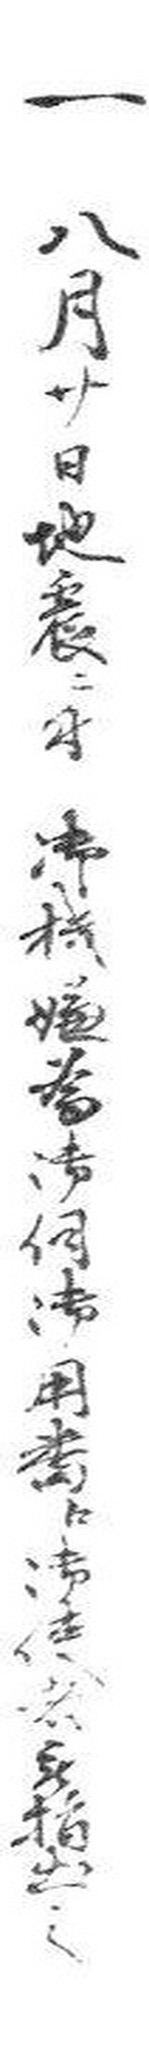一八月廿日地震ニ付御機嫌為御伺御用番江御使者被指出之
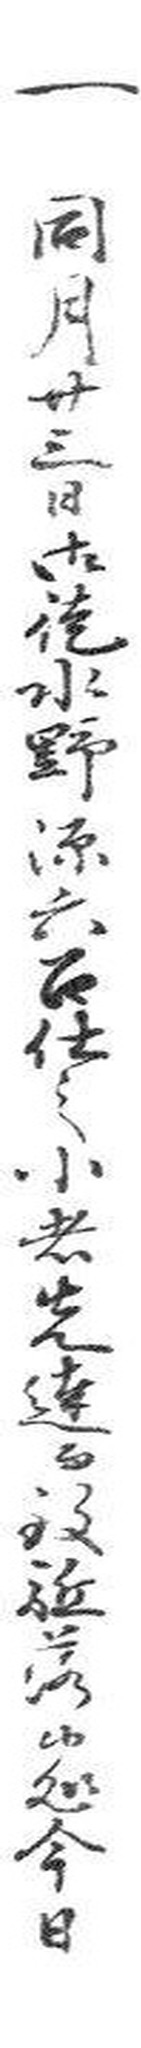一同月廿三日御徒水野源六召仕之小者先達而致駈落候処今日
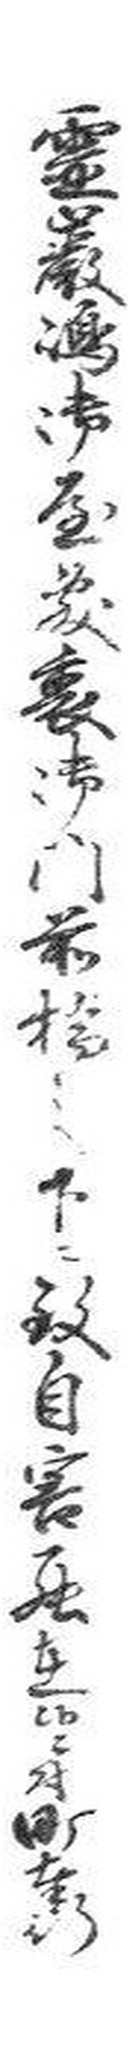霊巌島御屋敷裏御門前橋之下ニ致自害罷在候ニ付町奉行
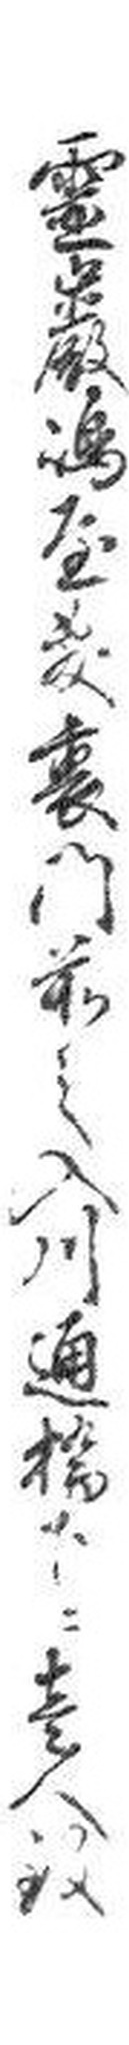霊巌島屋敷裏御門前之入川通橋下ニ壱人致
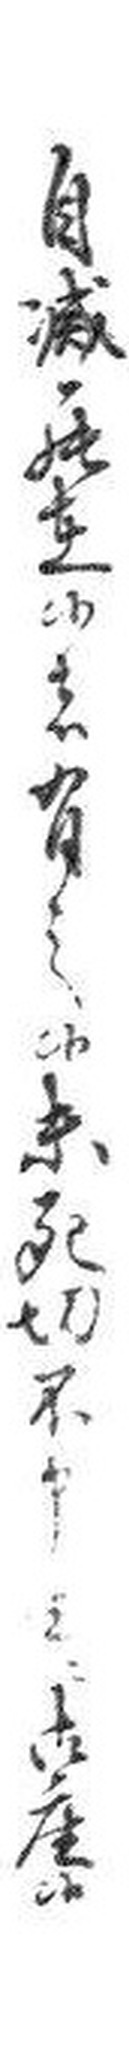自滅罷在候者有之候未死切不申立ニ御座候
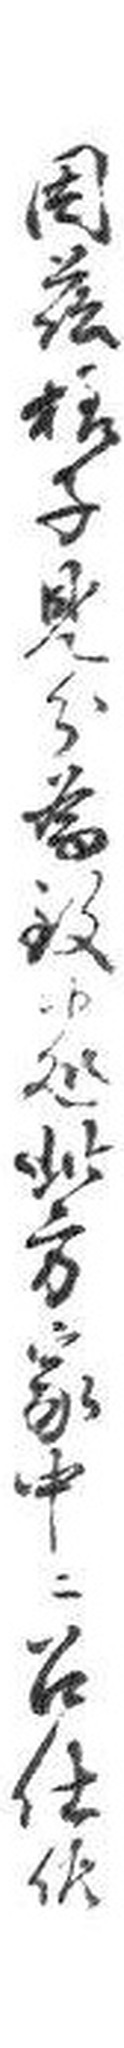因茲様子見分為致候処此方家中ニ召仕候
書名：家譜 二十八 吉邦公 従宝永七年七月五日到正徳元年十二月
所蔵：福井県文書館 Fukui Prefectural Archives
